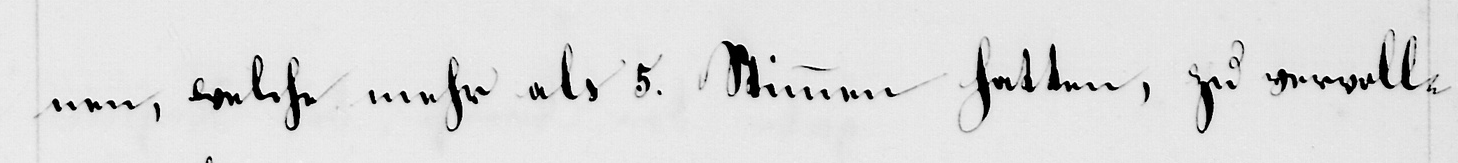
nen, welche mehr als 5. Stimmen hatten, zu vervoll¬
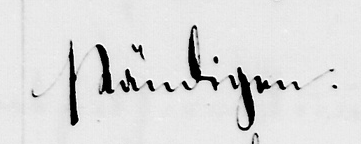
ständigen.
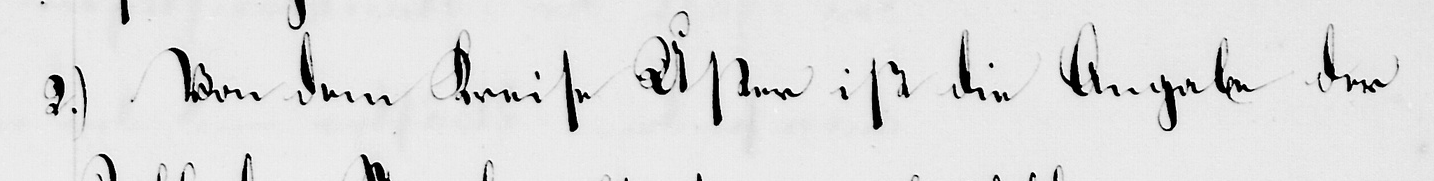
2.) Von dem Kreise Uster ist die Angabe der
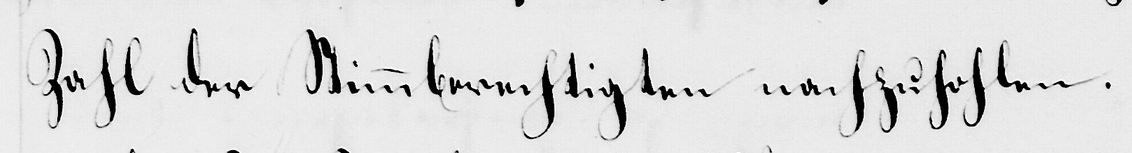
Zahl der Stimmberechtigten nachzuhohlen.
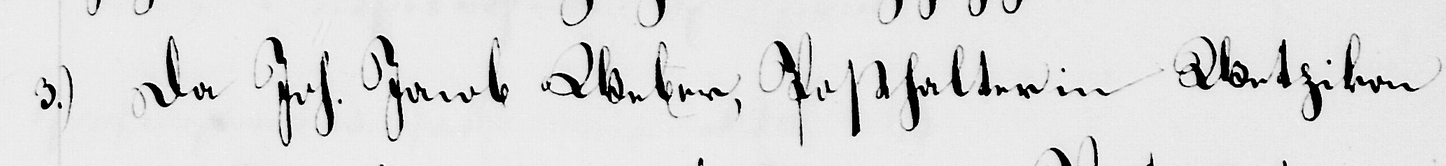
3.) Da Joh. Jacob Weber, Posthalter in Wetzikon
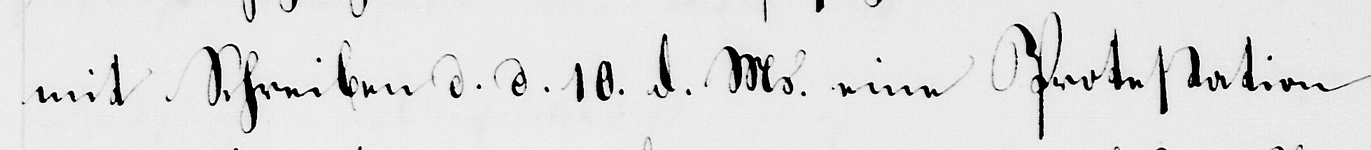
mit Schreiben d. d. 10. d. Ms. eine Protestation
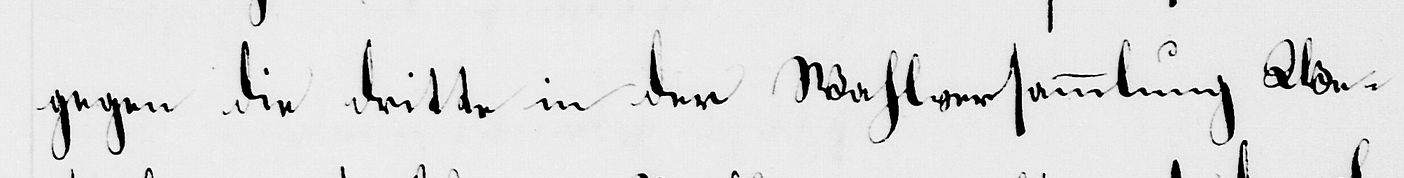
gegen die dritte in der Wahlversammlung We¬
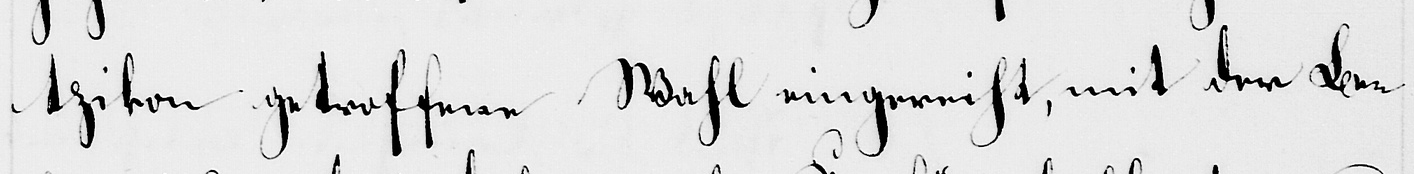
tzikon getroffene Wahl eingereicht, mit der Be¬
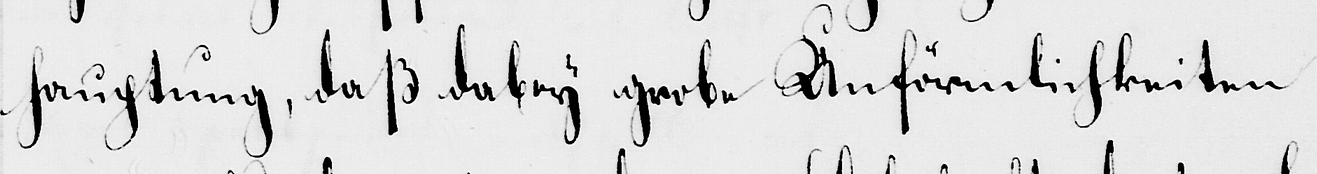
hauptung, daß dabey grobe Unförmlichkeiten
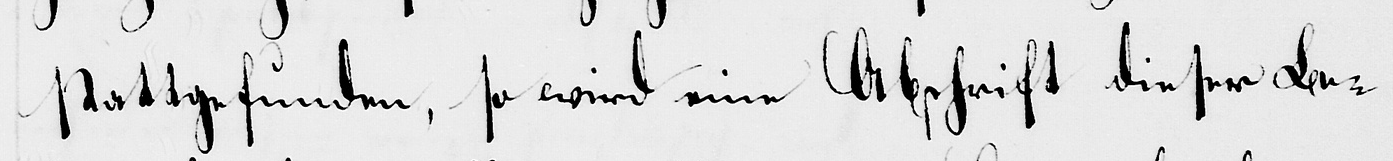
stattgefunden, so wird eine Abschrift dieser Be¬
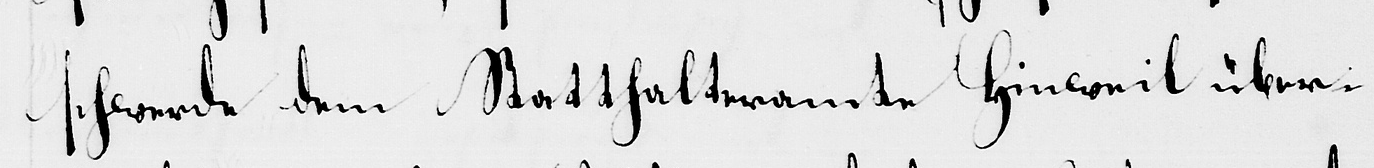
schwerde dem Statthalteramte Hinweil über¬
